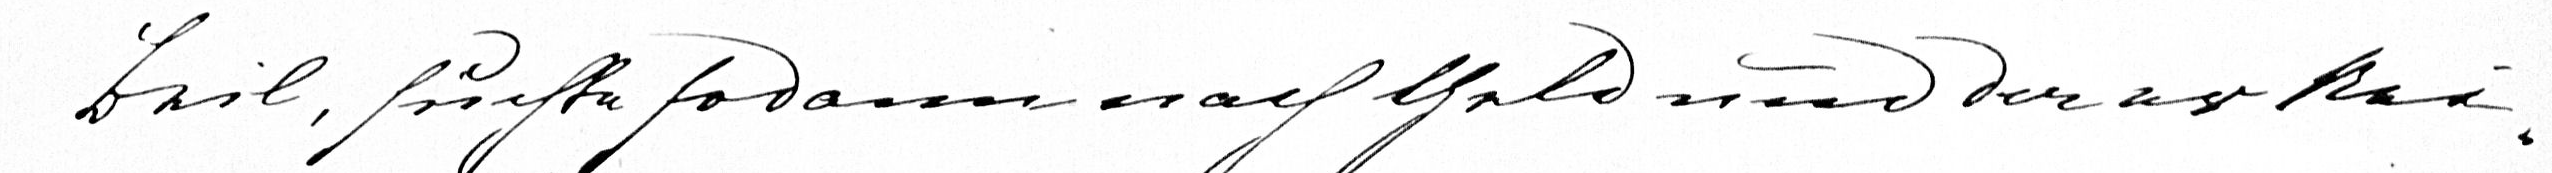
Beil, suchte sodann nach Geld und der er Kei¬
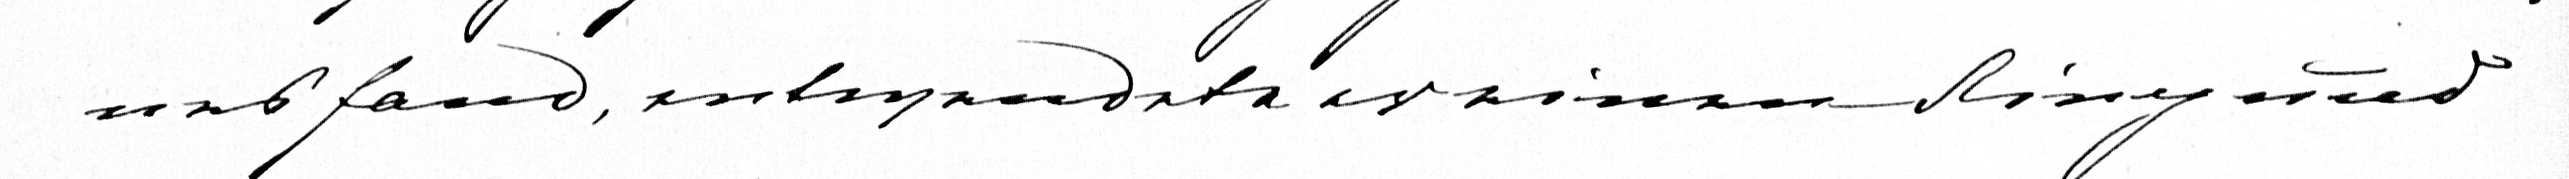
nes fand, entwendete er einen Ring und
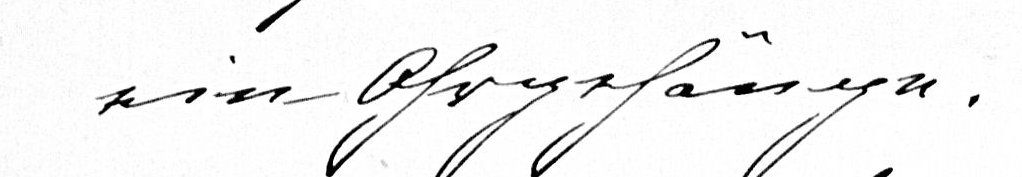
ein Ohrgehänge.
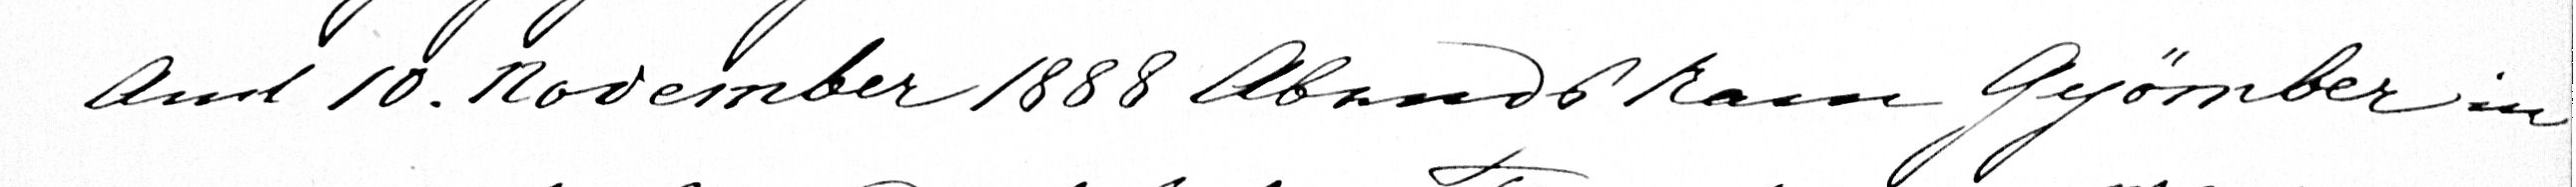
Amt 10. November 1888 Abends Kam Gyömber in
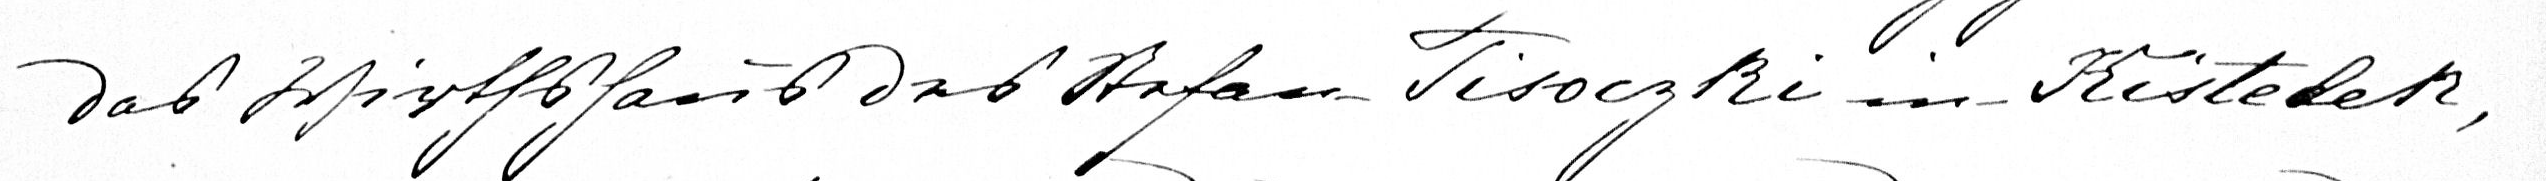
das Wirthshaus des Stefan Tisoczki in Kisteder,
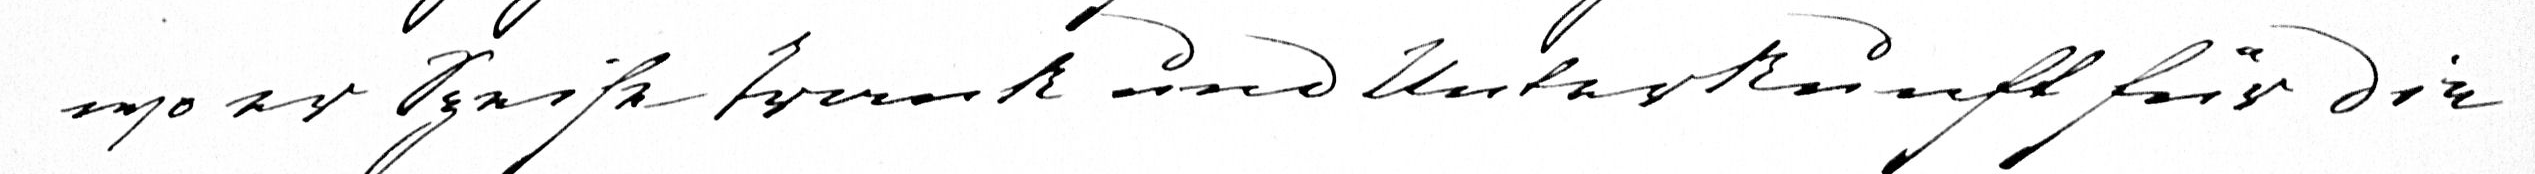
wo er Speise Trank und Unterkunft für die
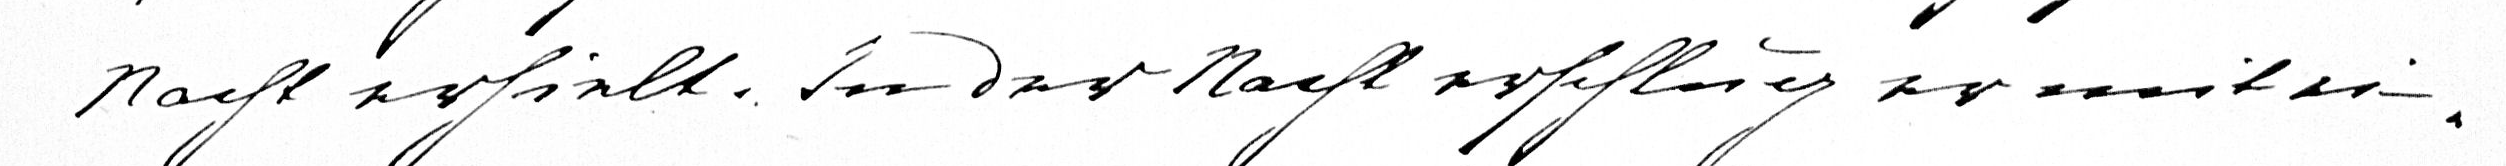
Nacht erhielt. In der Nacht erschlug er mit ei¬
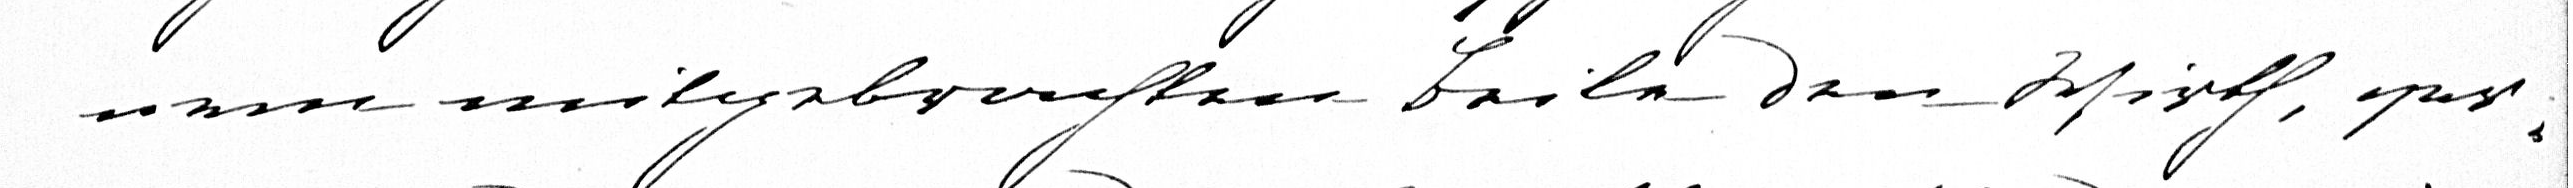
nem mit gebrachten Beile den Wirth, ver¬
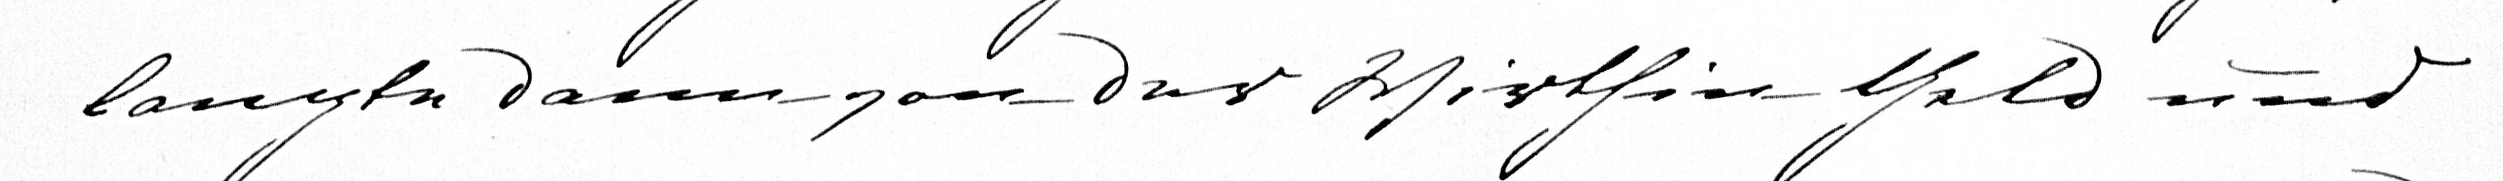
langte dann von der Wirthin Geld und
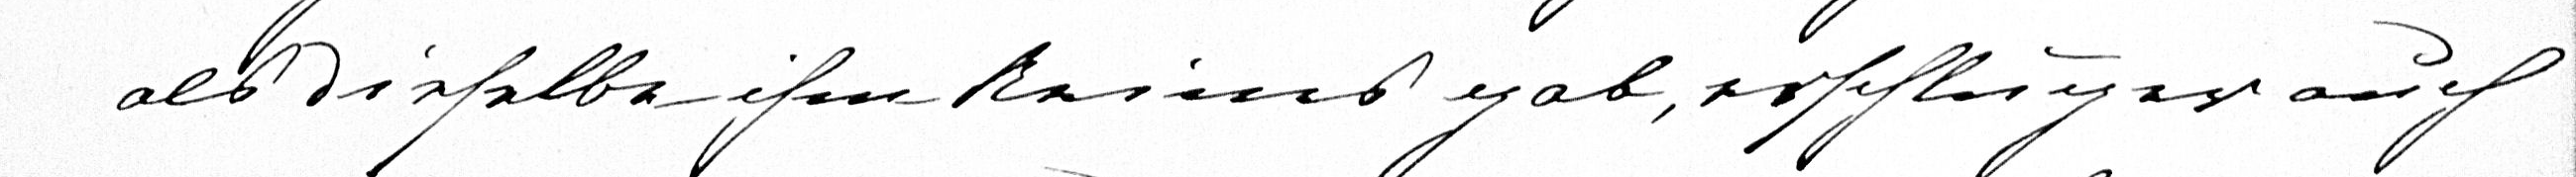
als dieselbe ihm Reims gab, erschlug er auch
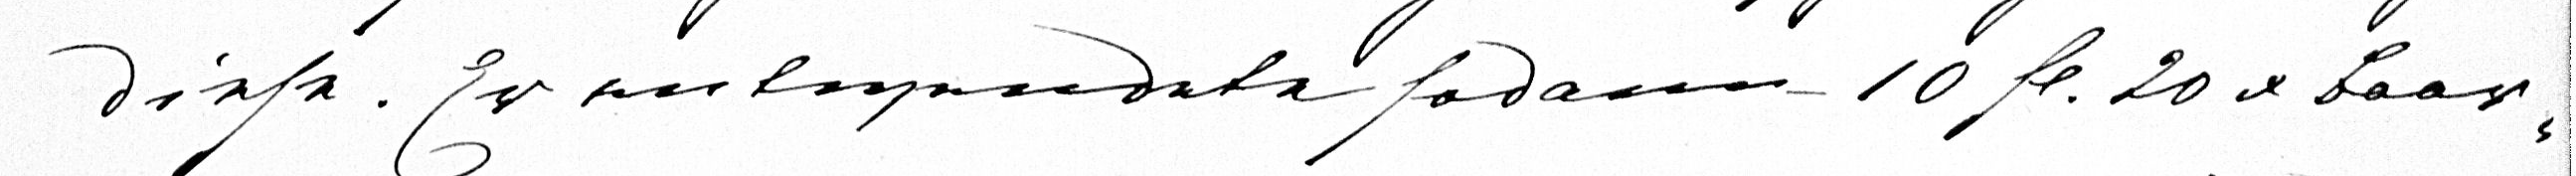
diese. Er entwendete sodann 10 fl. 20 x Baar¬
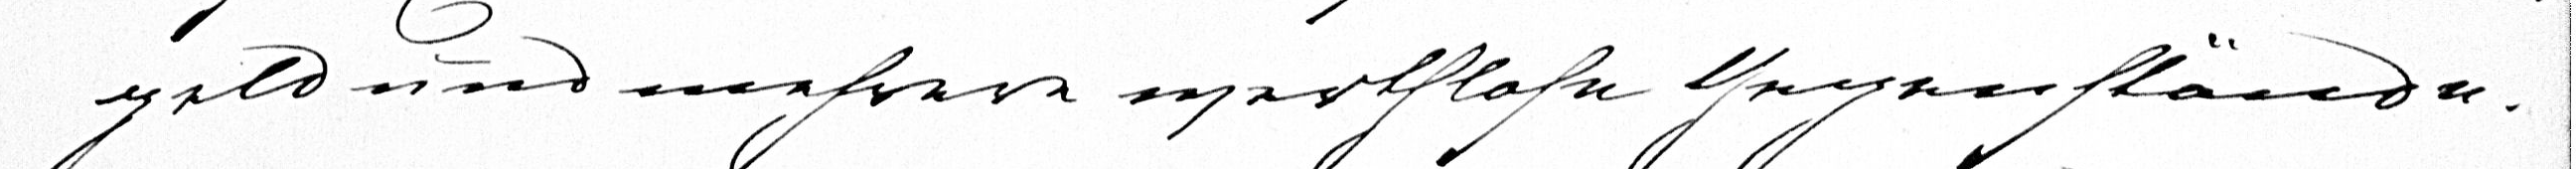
geld und mehrere werthlohn Gegenstände.
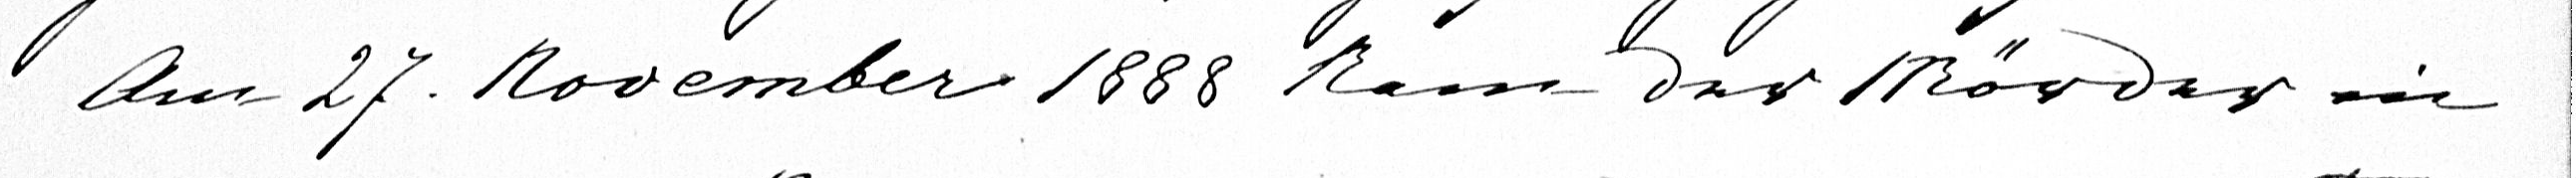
Am 27. November 1888 Ram der Mörder in
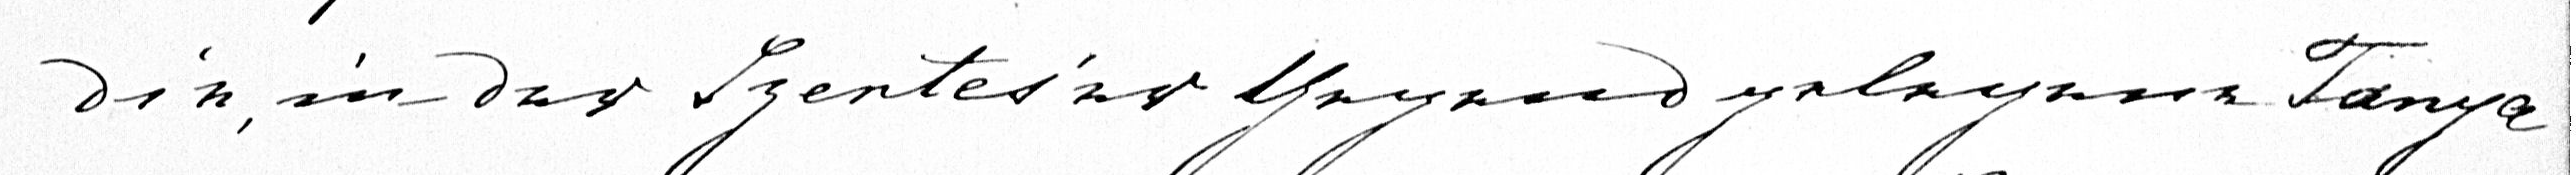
die, in der Szertes ér Gegend gelegene Tanya
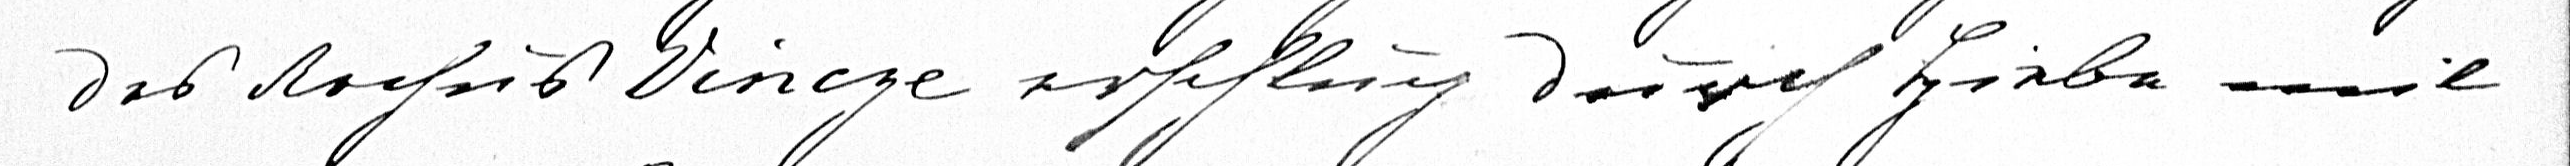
des Rochus Vincze erschlug durch Hiebe mit
